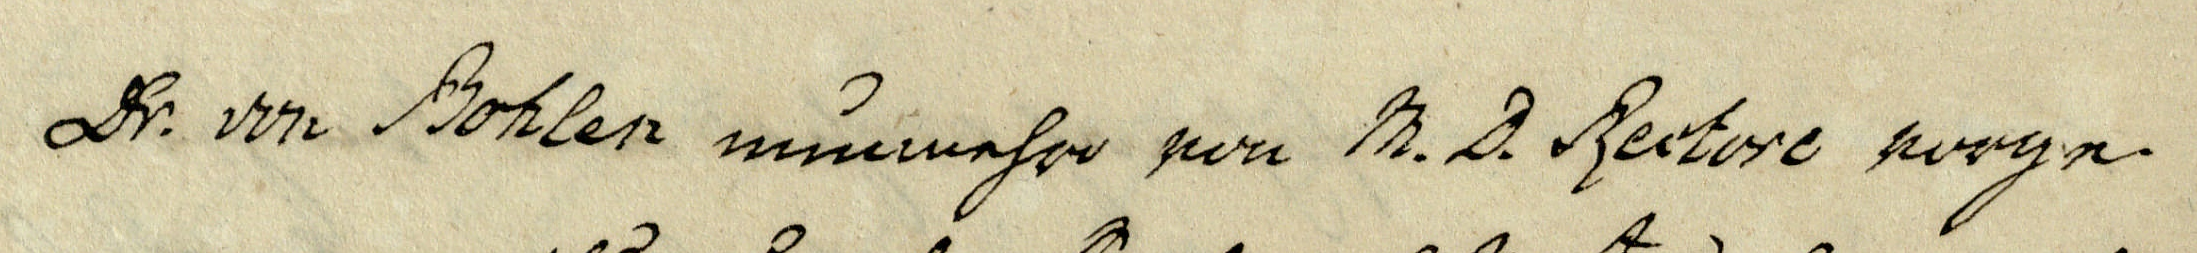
Dr. von Bohlen nunmehro von M. D. Rectore vorge¬
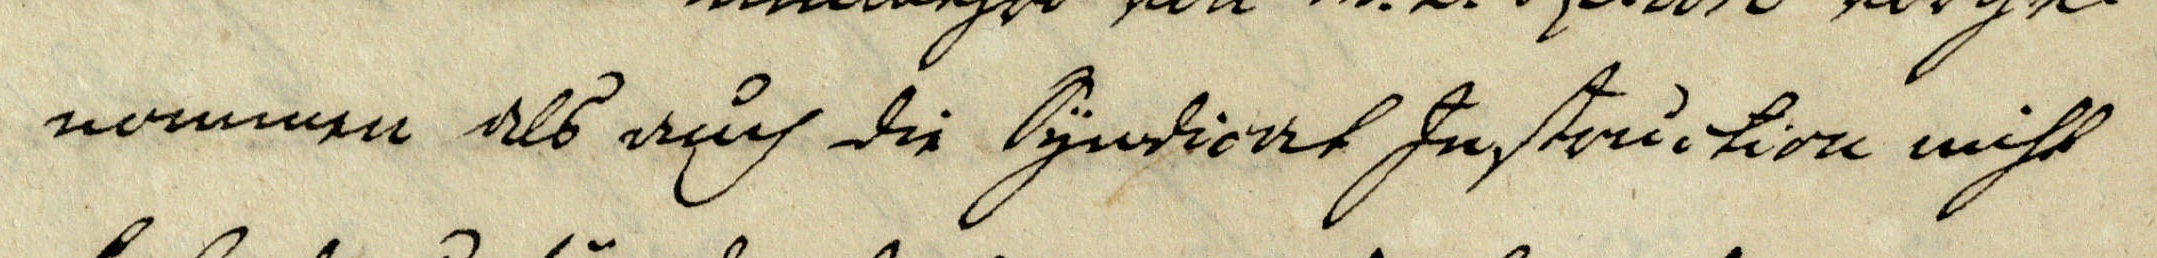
nommen als auch die Sÿndicat Instruction nicht
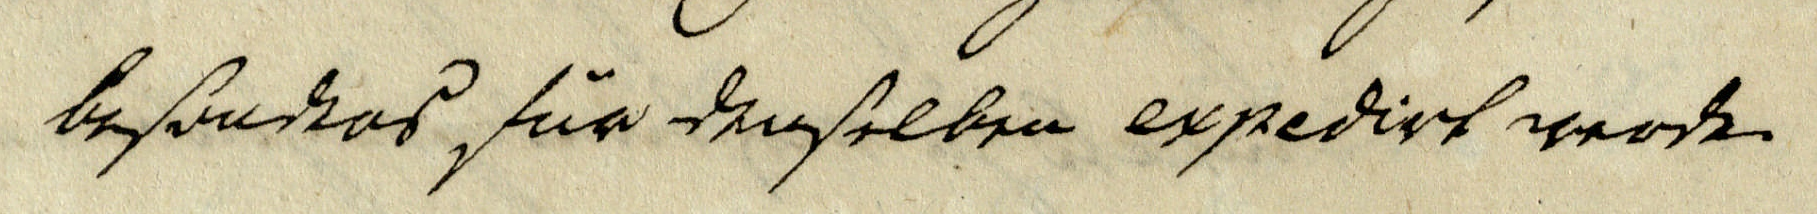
besonders für denselben expedirt werde.
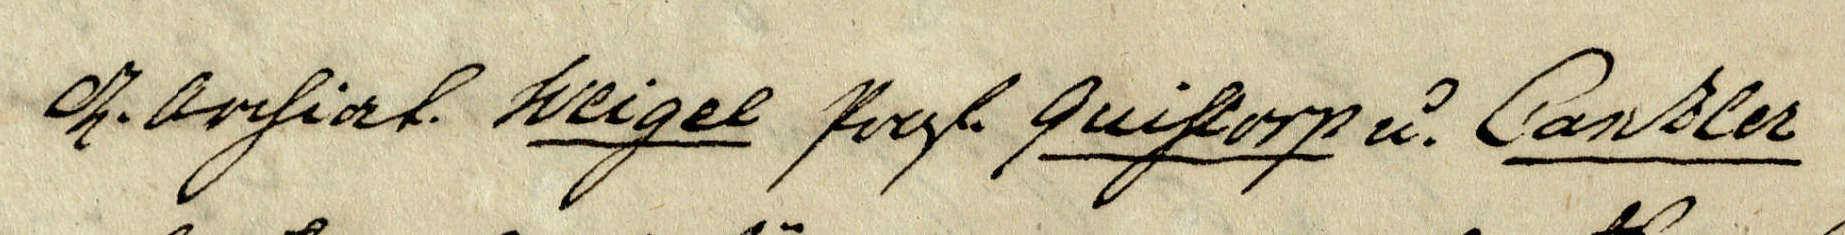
dh. Archiat. Weigel Prof. Quistorp u. Canzler
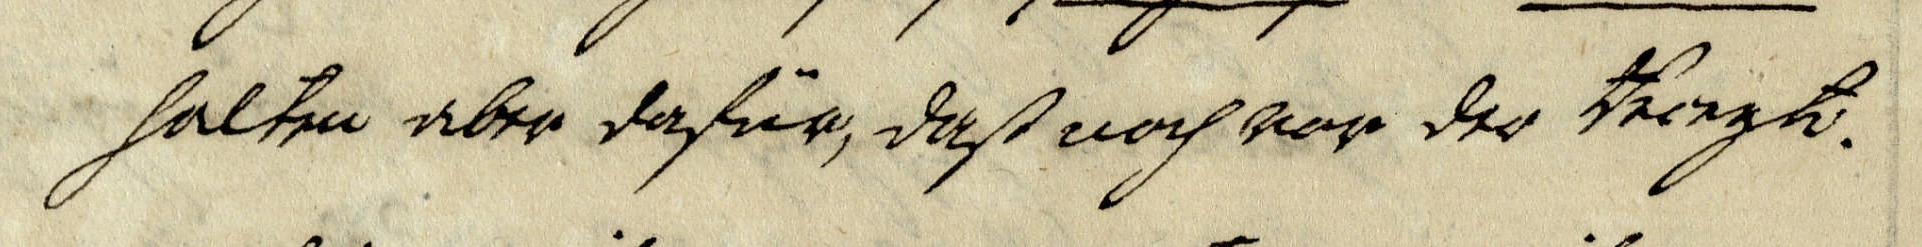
halten aber dafür, daß noch vor der Recepti¬
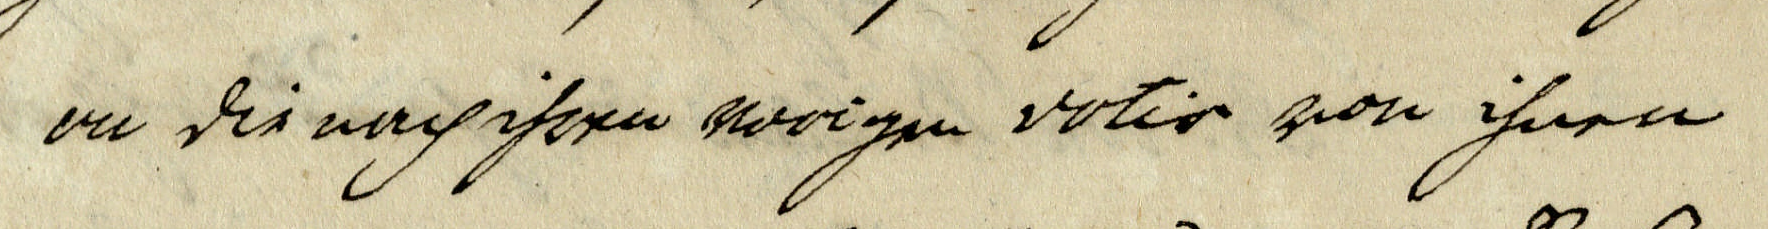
on die nach ihren vorigen votis von ihnen
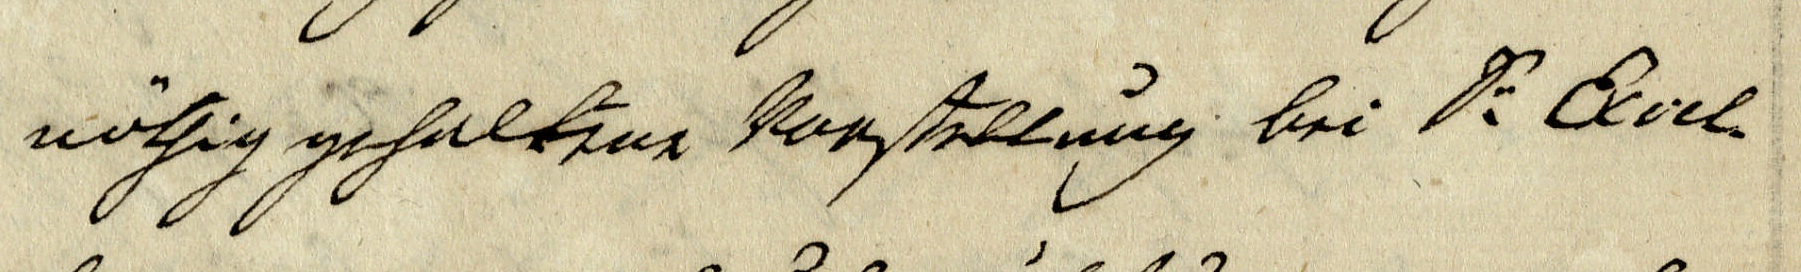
nöthig gehaltene Vorstellung bei Sr. Excel¬
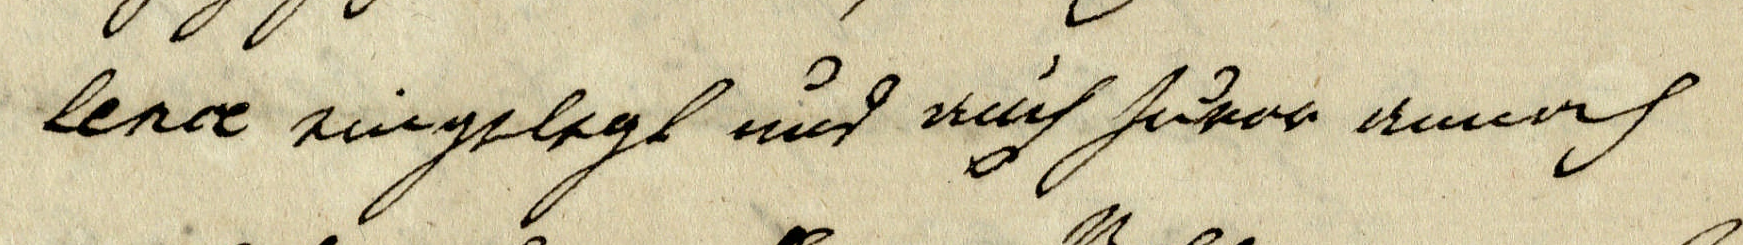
lence eingelegt und auch zuvor annoch
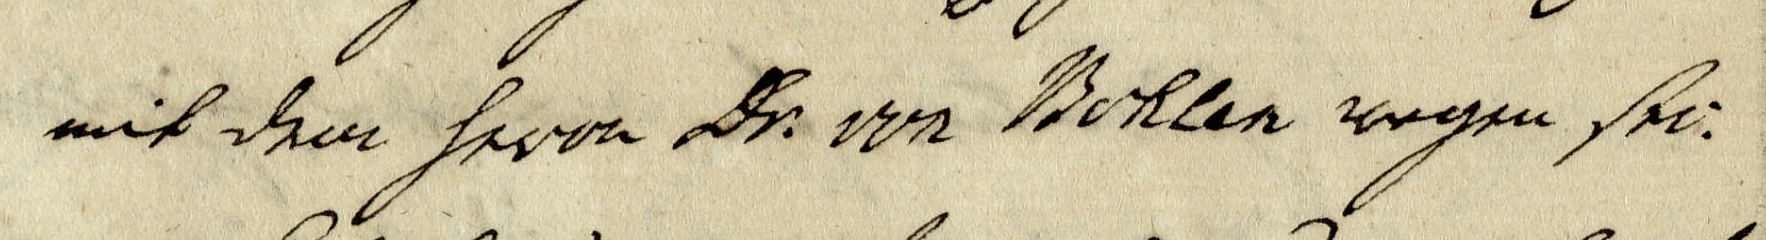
mit dem Herrn Dr. von Bohlen wegen sei¬
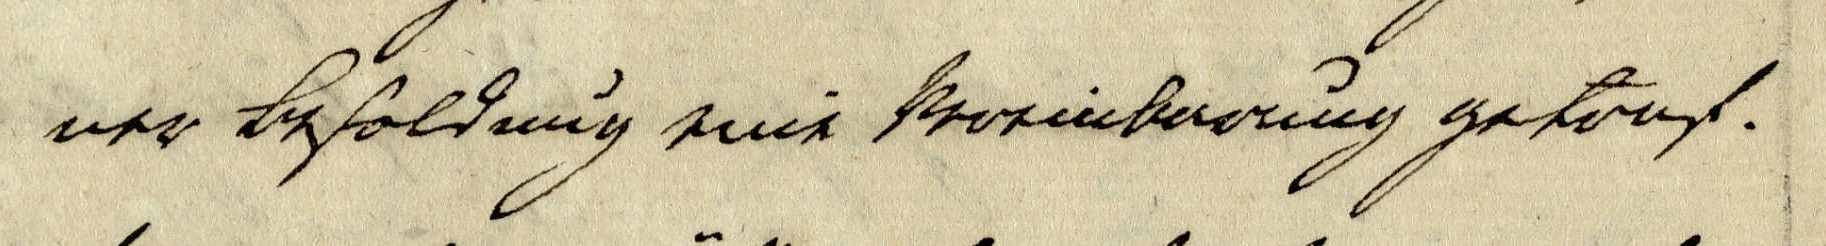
ner Besoldung eine Vereinbarung getrof¬
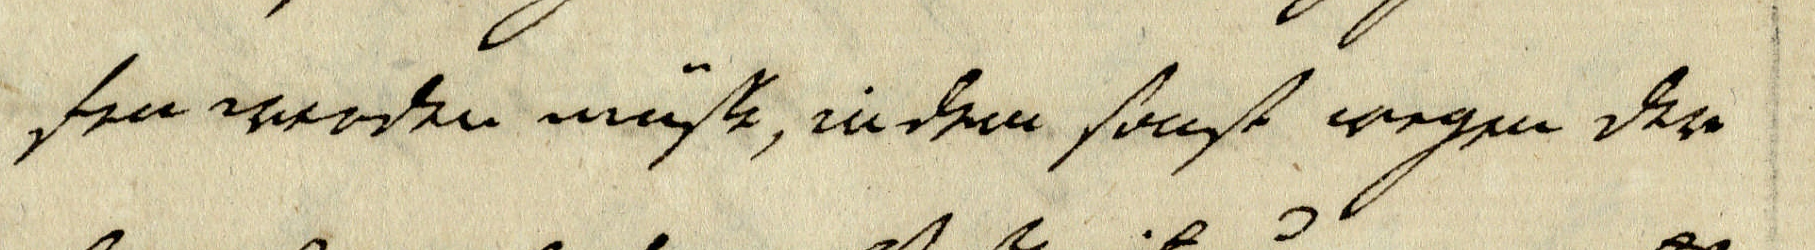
fen werden müsse, indem sonst wegen der
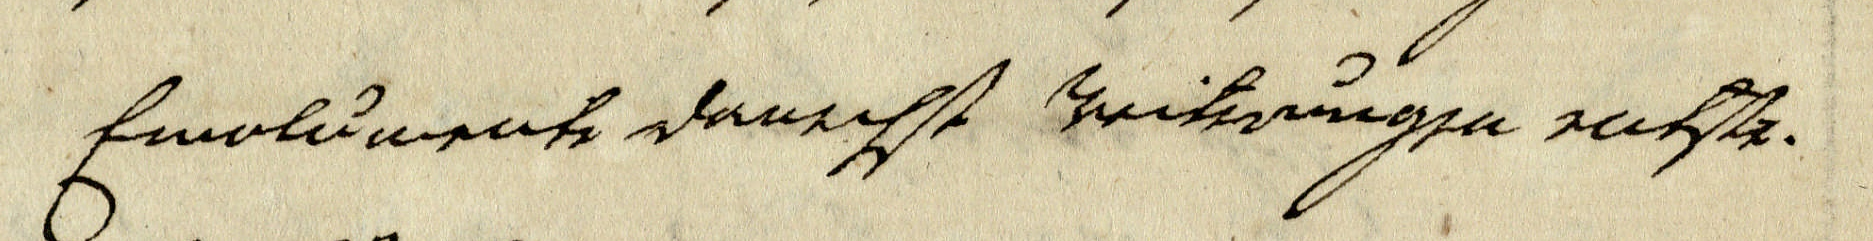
Emolumente danechst Weiterungen entste¬
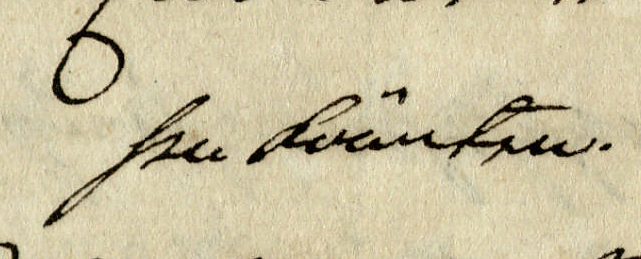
hen könnten.
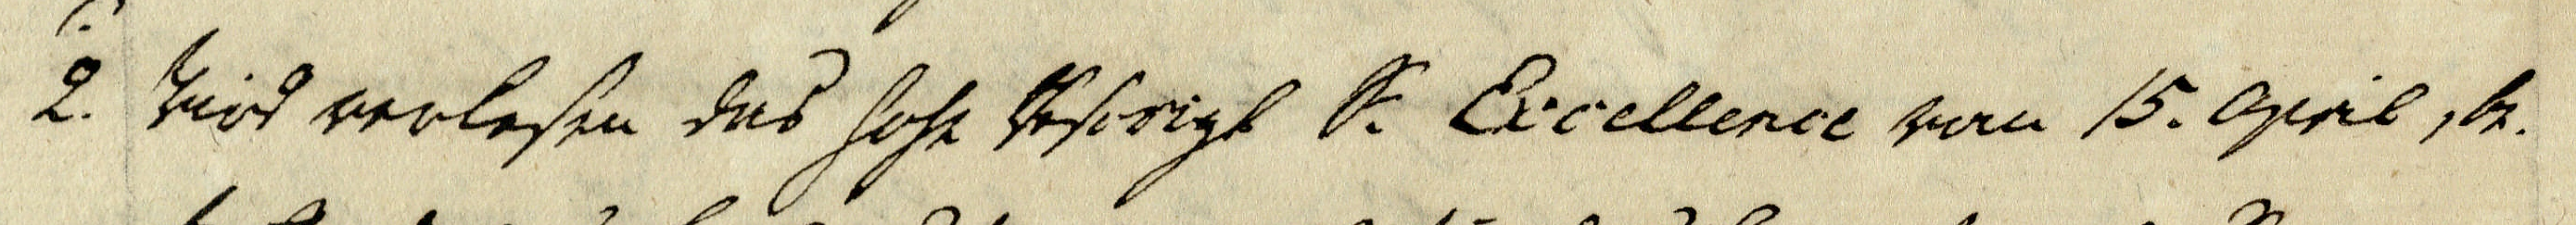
2. Wird verlesen das hohe Rescript Sr Excellence vom 15. April, be¬
